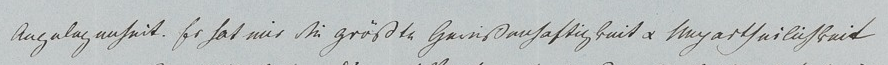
Angelegenheit. Er hat mir die größte Gewißenhaftigkeit & Unpartheilichkeit
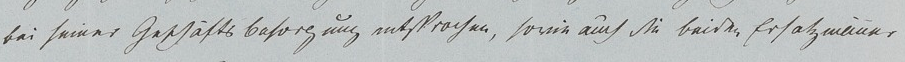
bei seiner Geschäftsbesorgung entsprochen, sowie auch die beiden Ersatzmänner
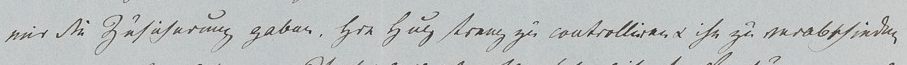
mir die Zusicherung gaben, Hrn Hug streng zu controlliren & ihn zu verabschieden
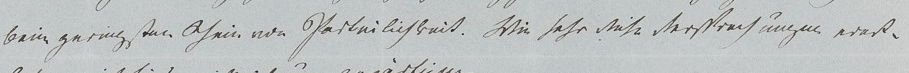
beim geringsten Schein von Parteilichkeit. Wie sehr diese Versprechungen ernst-
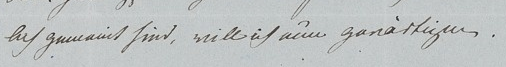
lich gemeint sind, will ich nun gewärtigen.
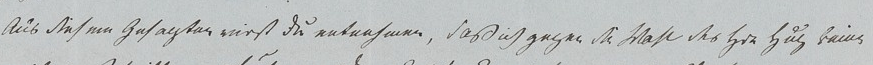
Aus diesem Gesagten wirst du entnehmen, daß ich gegen die Wahl des Hrn Hug keine
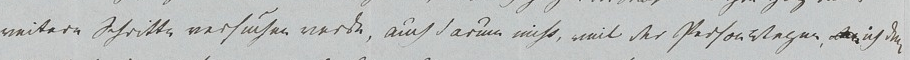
weitern Schritte versuchen werde, auch darum nicht, weil der Person wegen, ich den
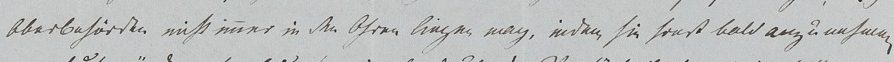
Oberbehörden nicht immer in den Ohren liegen mag, indem sie sonst bald anzunehmen
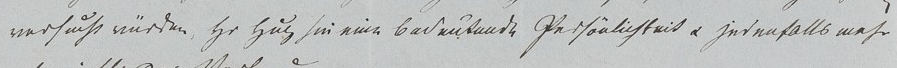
versucht würden, Hr Hug sei eine bedeutende Persönlichkeit & jedenfalls mehr
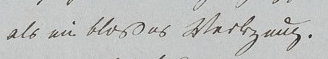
als ein bloßes Werkzeug.
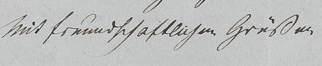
Mit freundschaftlichen Grüßen
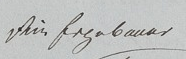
Dein Ergebener
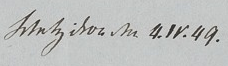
Wetzikon den 4.IV.49.
